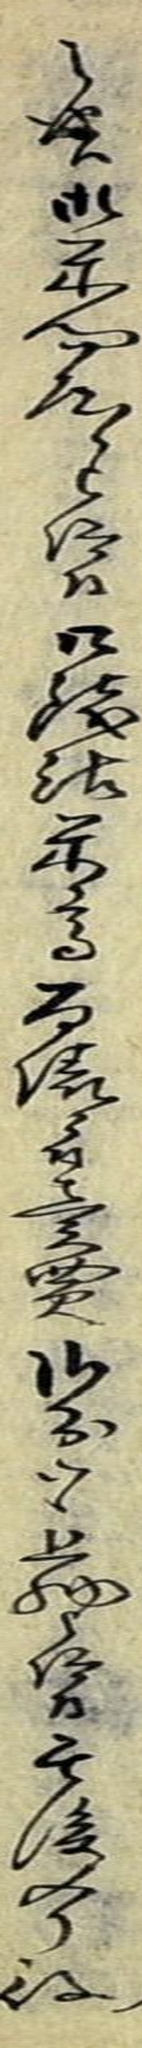之儀御米問屋へ被仰付口銭銀米高百俵に付売買弐分つヽ上納被仰付其後〆り役
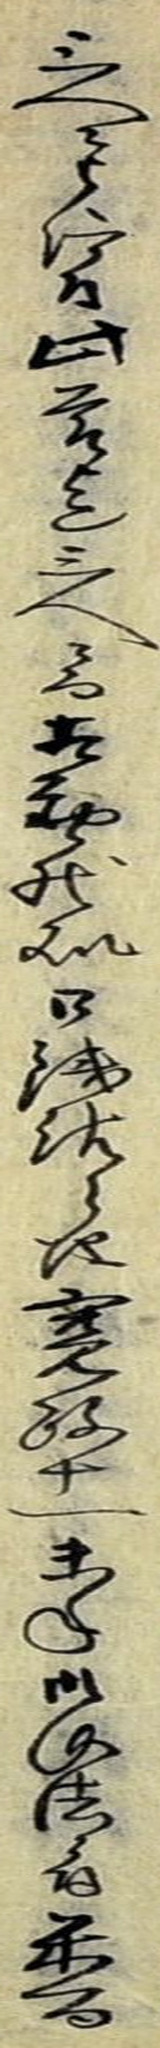三人に被仰付此節迄三人に而相勤然処口銭銀之儀寛政十一未年御趣法に付米百
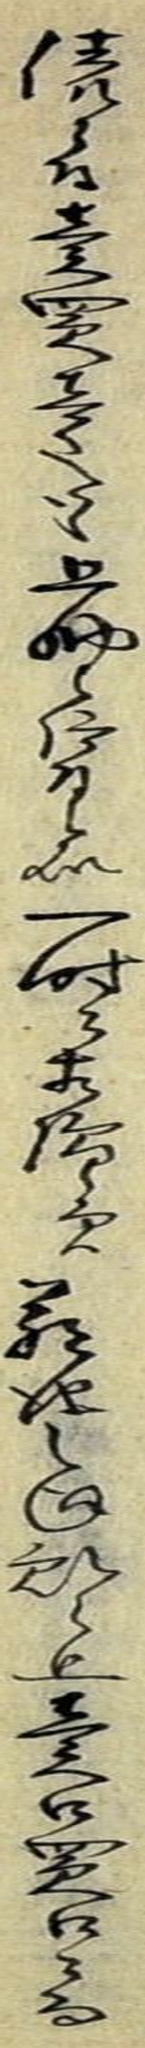俵に付売買壱匁つヽ上納被仰付候処一時に相増候而は難儀之趣願之上売口買口に而
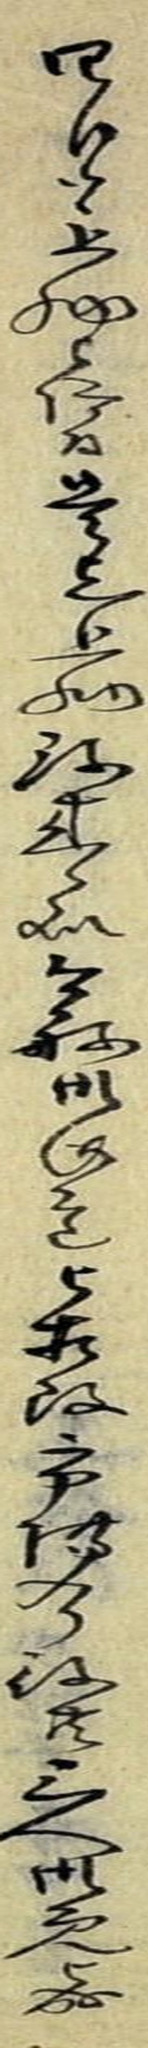四匁つヽ上納被仰付是迄上納致来候処今般御趣意被相改市場〆り役共三人御免被成
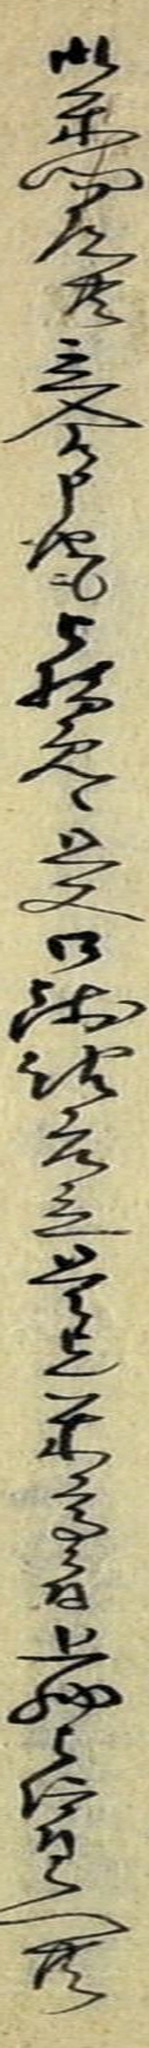御米問屋共立合申儀も被指免候且又口銭銀取立是迄米高に付上納被仰付候へ共
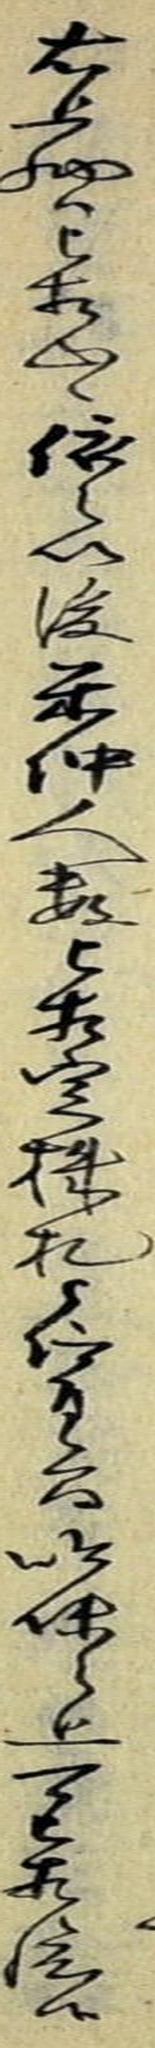右上納は被相止候依之以後米仲人数被相定株札被仰付候間吟味之上可被相渡候
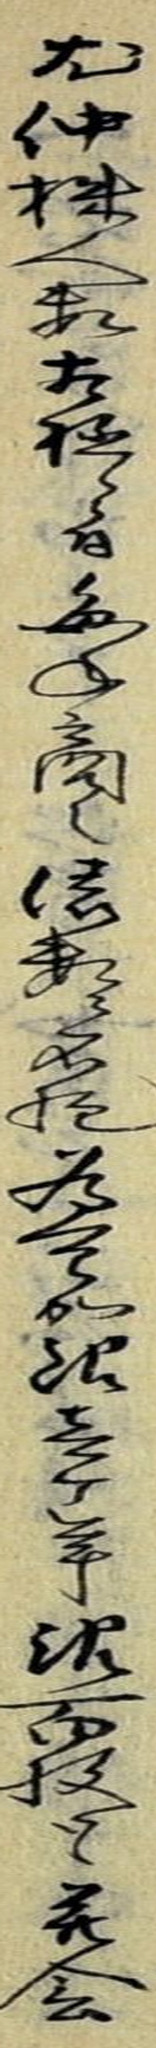尤仲株人数相極候に付毎年商之俵数に不拘為冥加銀壱ヶ年銀百枚つヽ并会
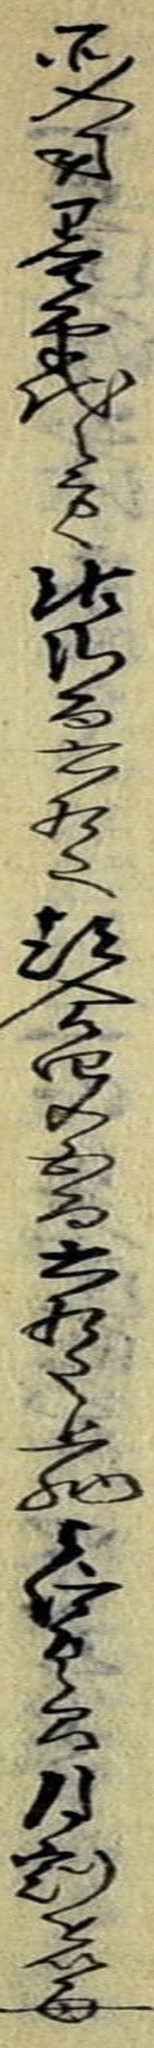所入用墨筆代之方へ銀弐百六拾匁都合四〆五百六拾匁上納被仰付候間月割を以毎
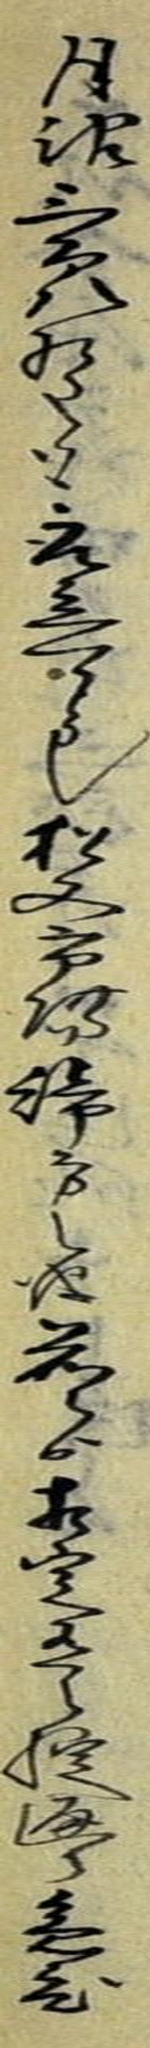月銀三百八拾匁つヽ取立可被申候猶又市場締方之儀前々ゟ相定有之掟通り急度
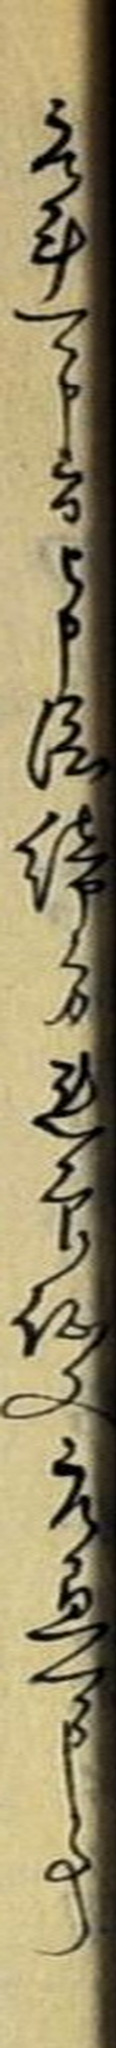取斗可申旨被申渡締り方連印証文取置可申事
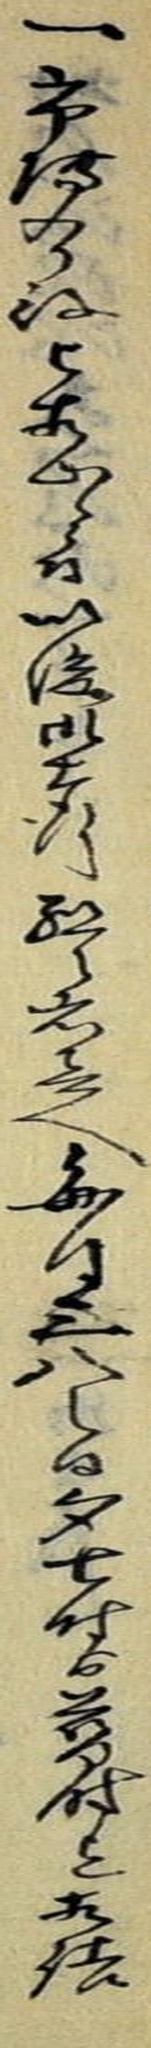一市場〆り役被相止候に付以後御奉行組之者壱人毎月三八之日夕七時ゟ暮時迄相詰
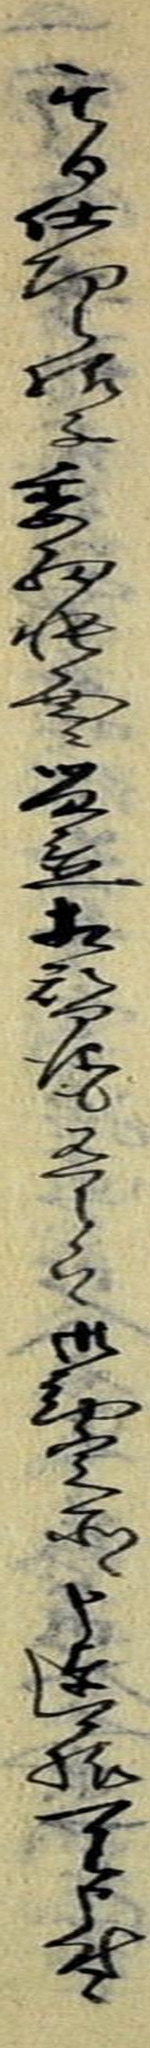其日仕切之様子委細帳面に留置相替儀も有之候はヽ御勘定所へ申達候様可被申候
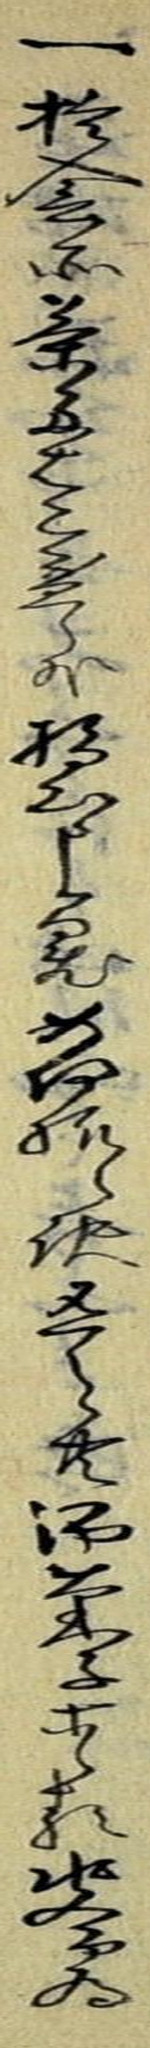一於会所茶たはこ盆之外指出申間敷如何様之訳有之候共酒菓子等之類決而為
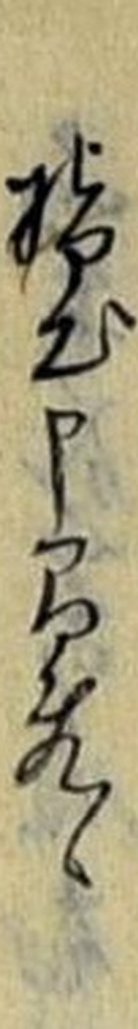指出申間敷候
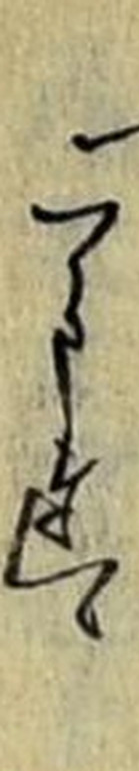可申達候
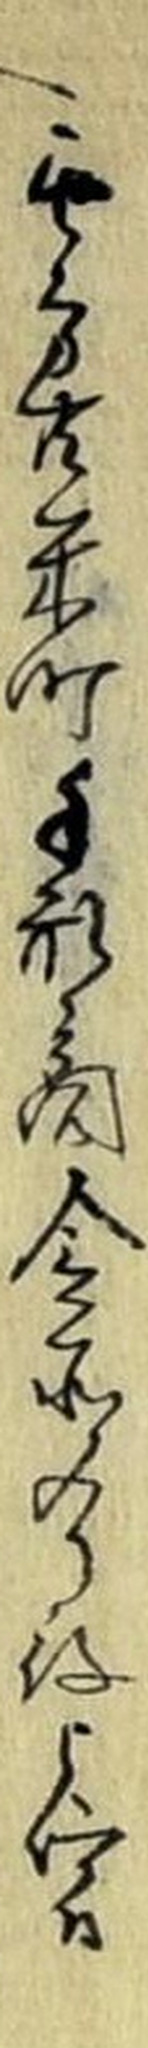其方共米町手形商会所〆り役被仰付〆り役
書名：命令之部 四
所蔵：福井県文書館 Fukui Prefectural Archives
